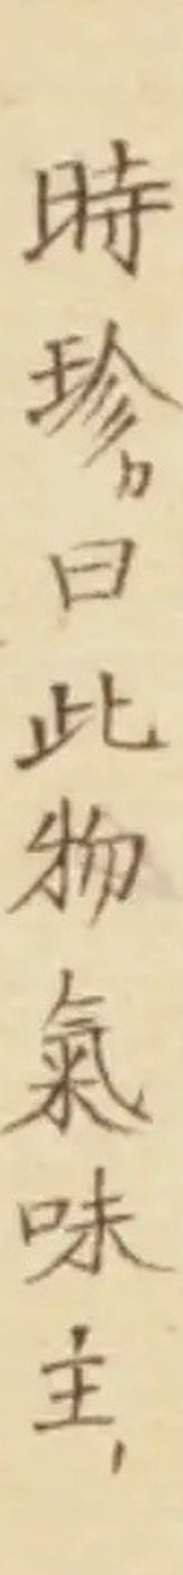時珍か曰此物氣味主と

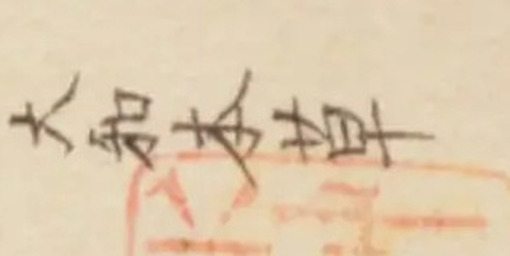大和本草
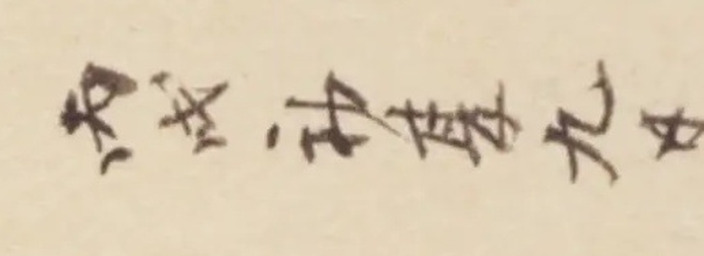丙戌初夏九日真寫
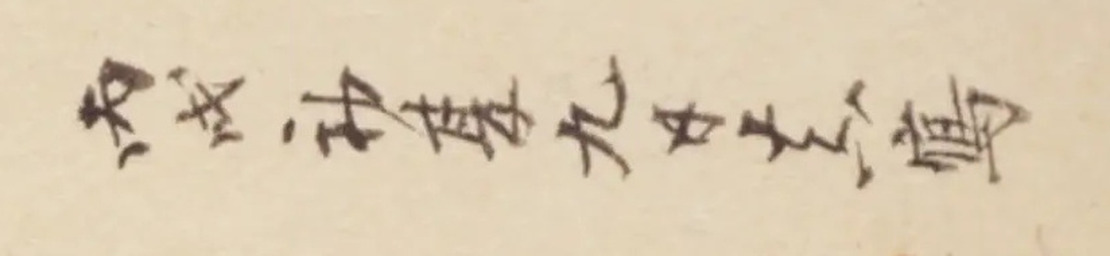丙戌初夏九日真寫
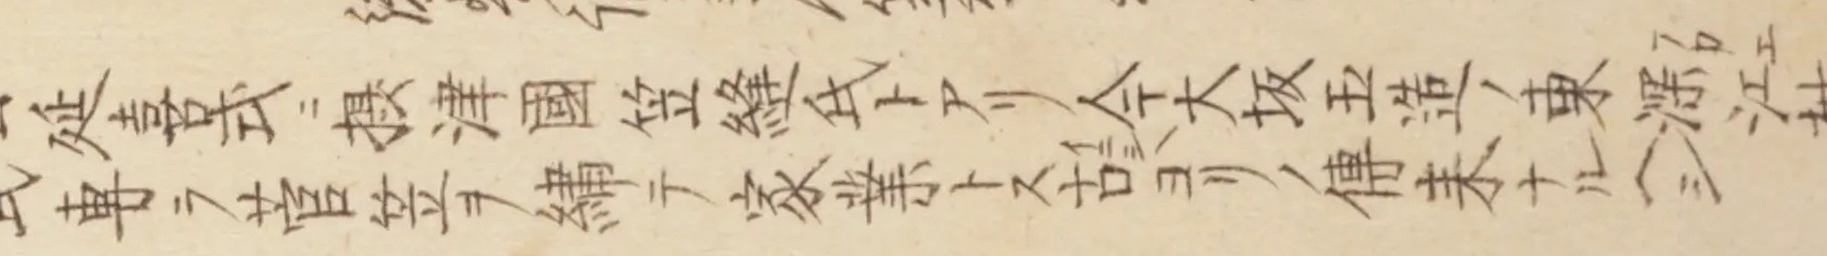又云延喜式に摂津國笠縫氏とある今大坂玉造の東深江村の
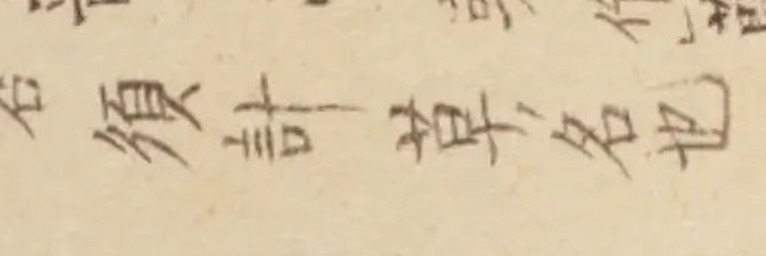和名須計草の名也
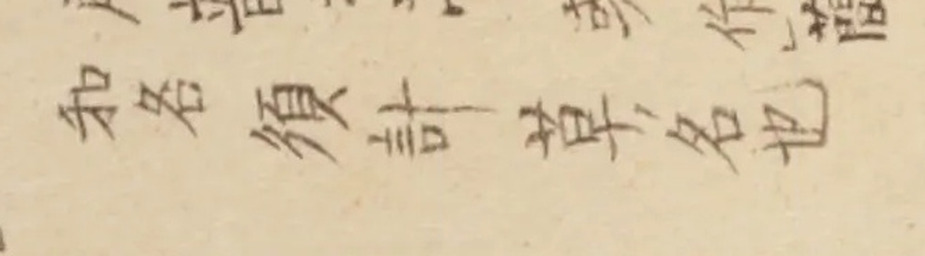和名須計草の名也
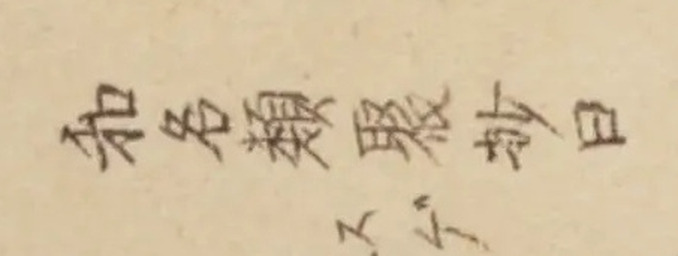和名類聚抄に曰

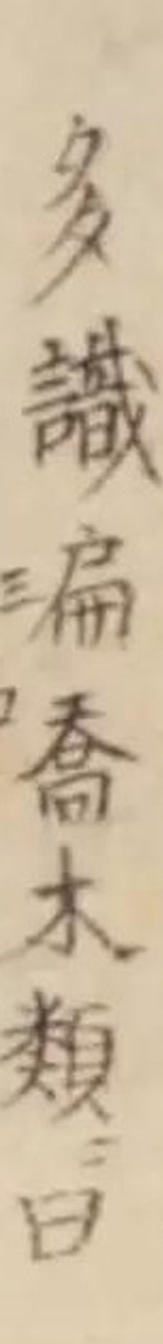多識編喬木類ニ曰
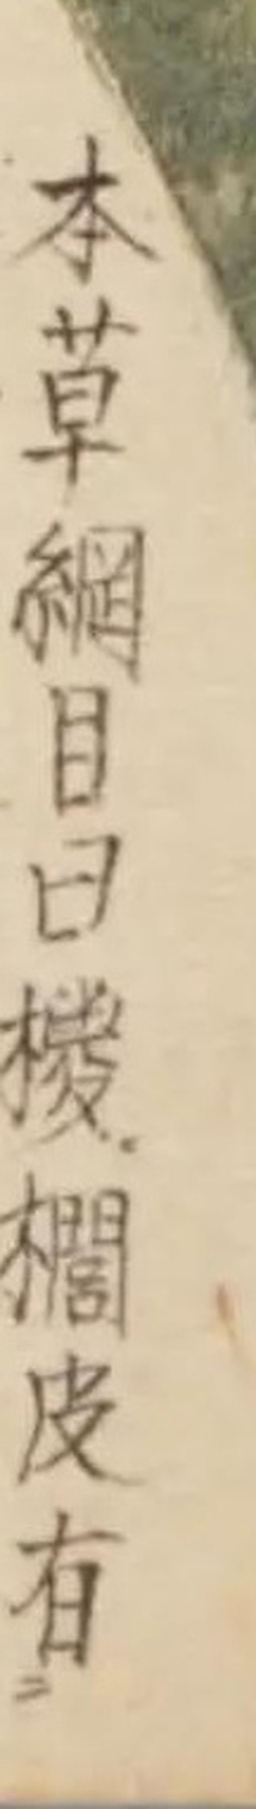本草綱目曰椶櫚皮有
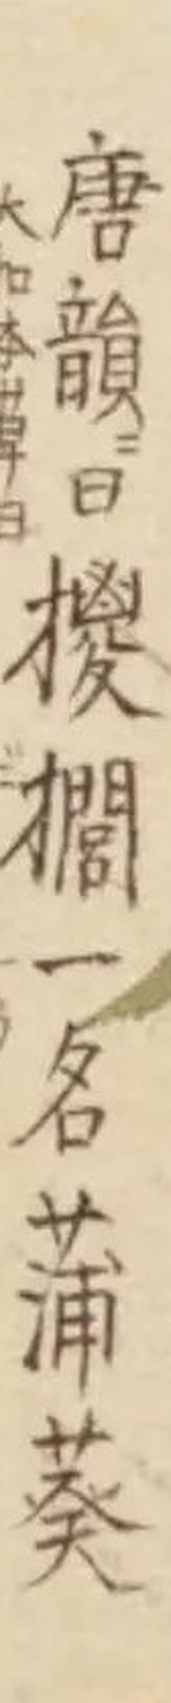唐韻に曰椶櫚一名蒲葵
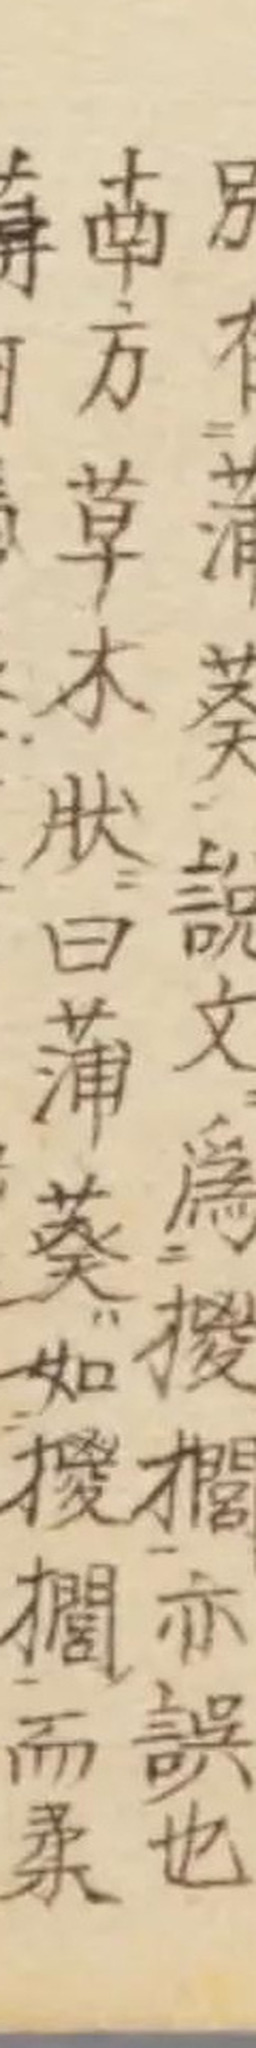南方草木状に曰蒲葵は如椶櫚の而柔
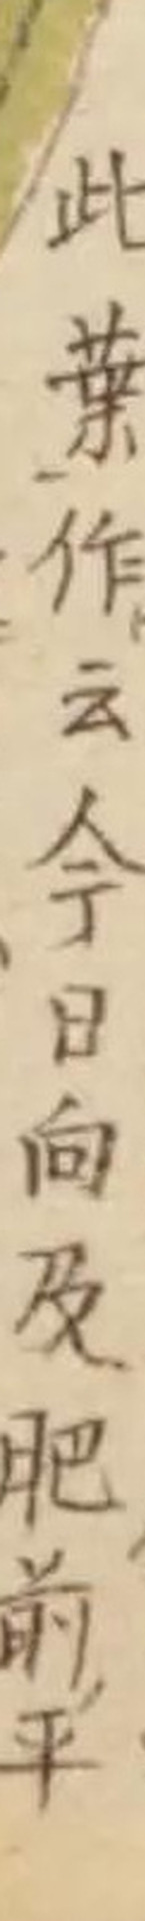此葉作ると云今日向及肥前の平
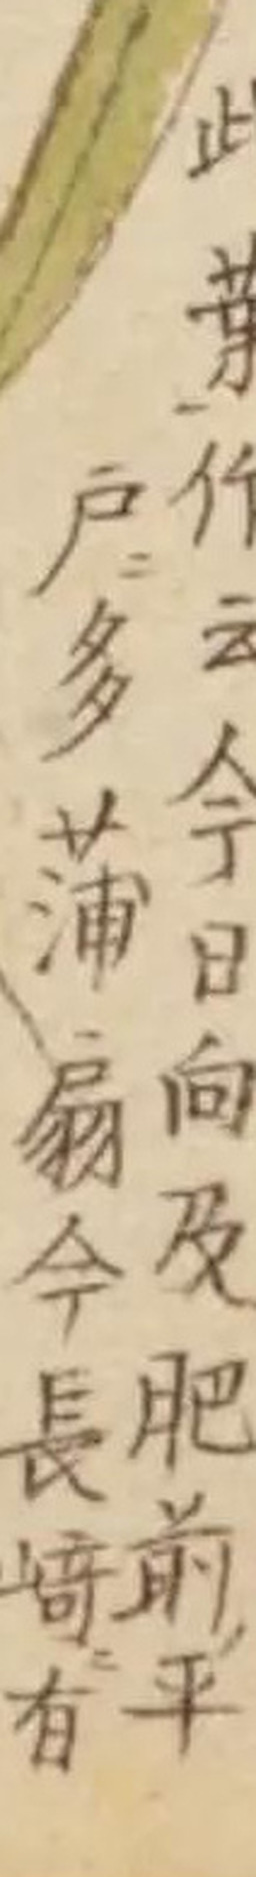戸に多蒲扇今長崎に有
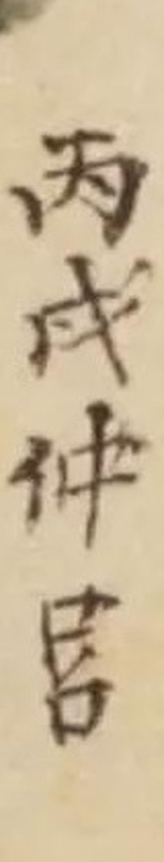丙戌仲呂
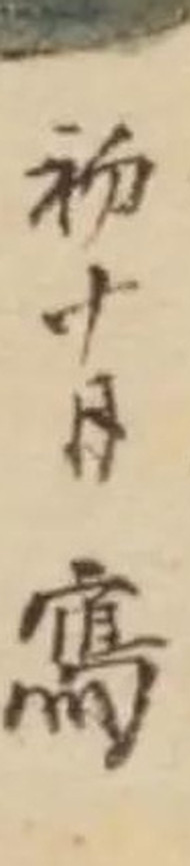初十日寫
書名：梅園草木花譜夏之部. 3
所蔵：国立国会図書館 National Diet Library, JAPAN
